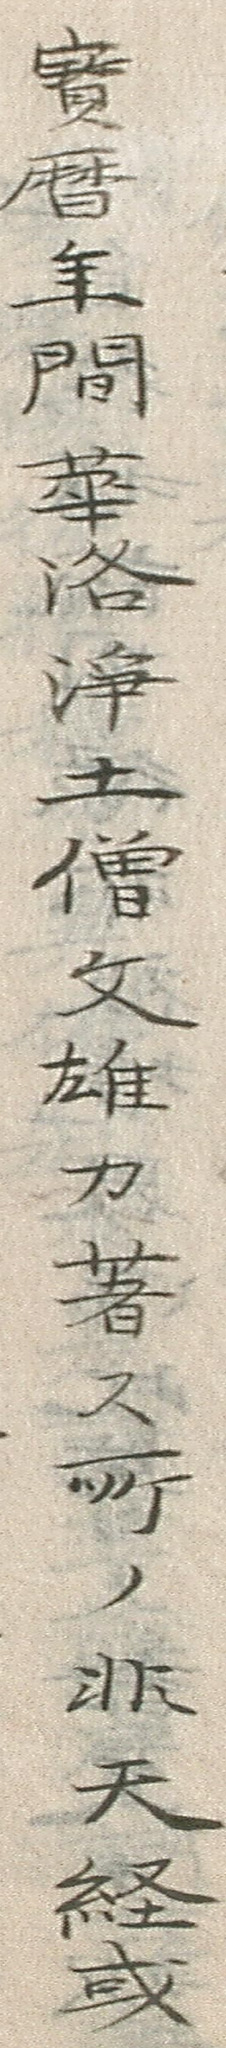宝暦年間華洛浄土僧文雄カ著ス所ノ非天経或
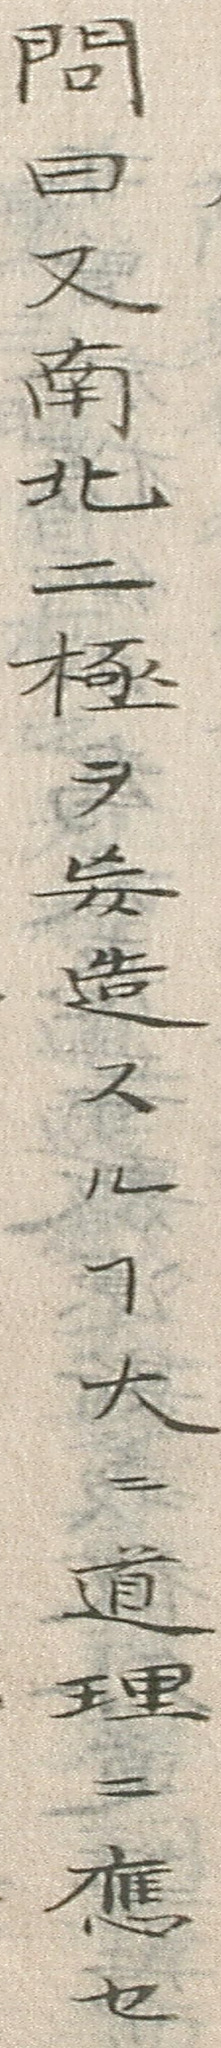問曰又南北二極ヲ妄造スルコト大ニ道理ニ応セ
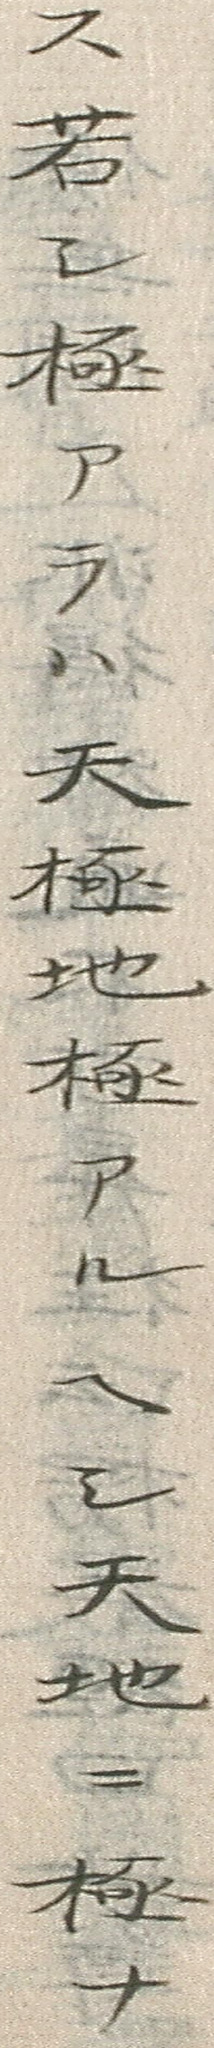ス若シ極アラハ天極地極アルヘシ天地ニ極ナ
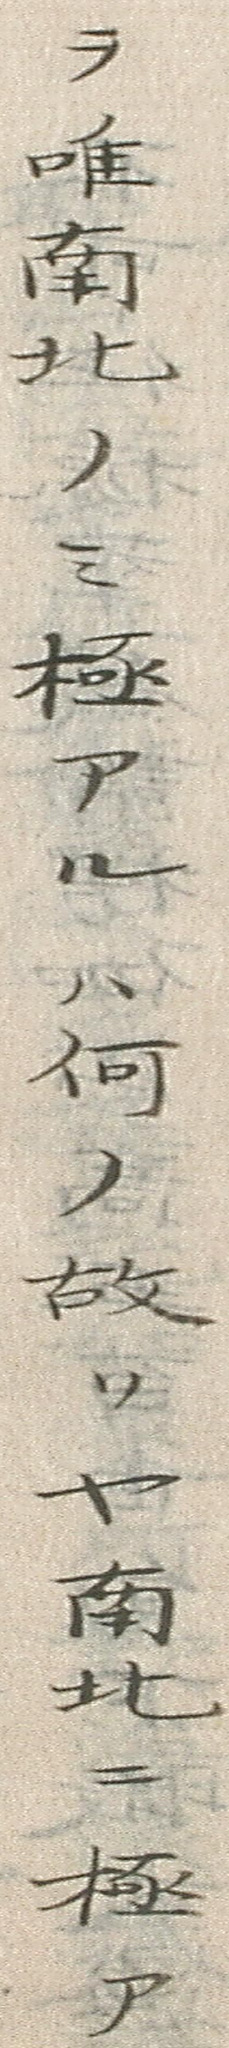ヲ唯南北ノミ極アルハ何ノ故リヤ南北ニ極ア
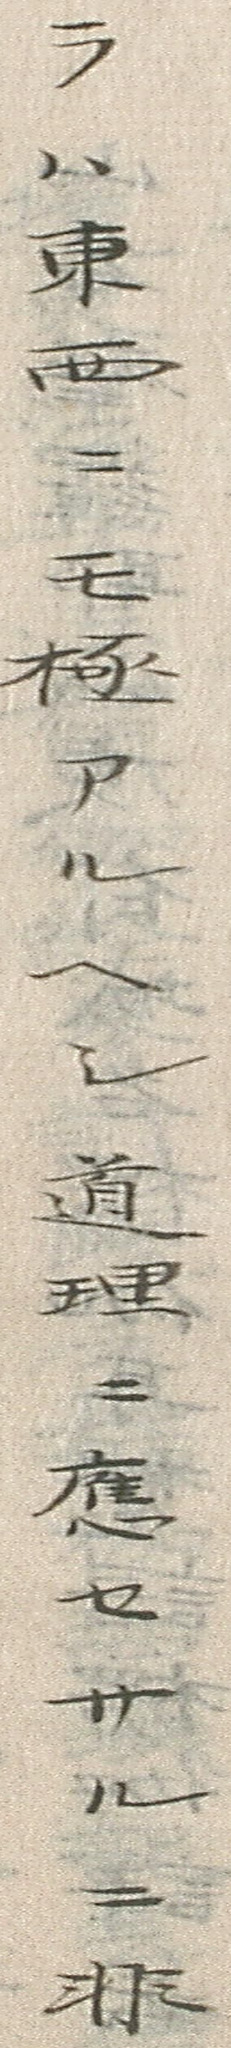ラハ東西ニモ極アルヘシ道理ニ応セサルニ非
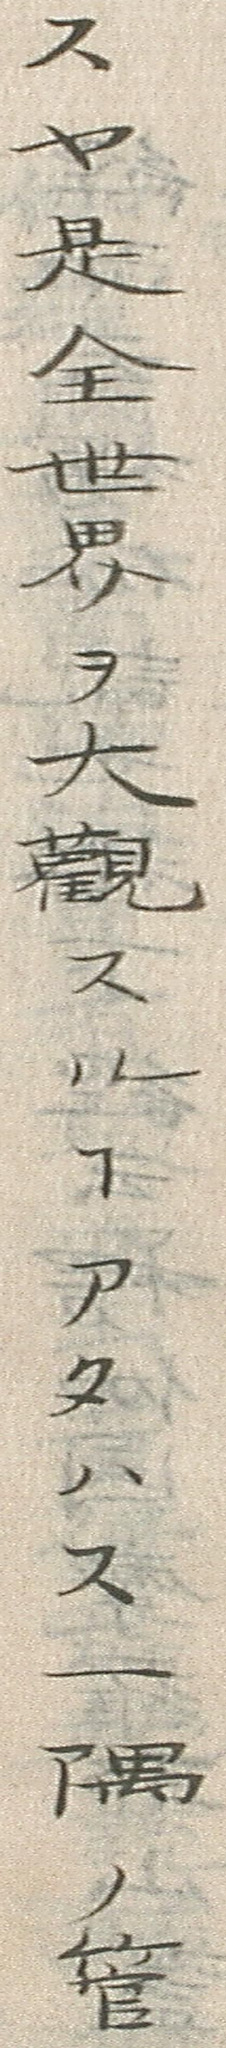スヤ是全世界ヲ大観スルコトアタハス一隅ノ管
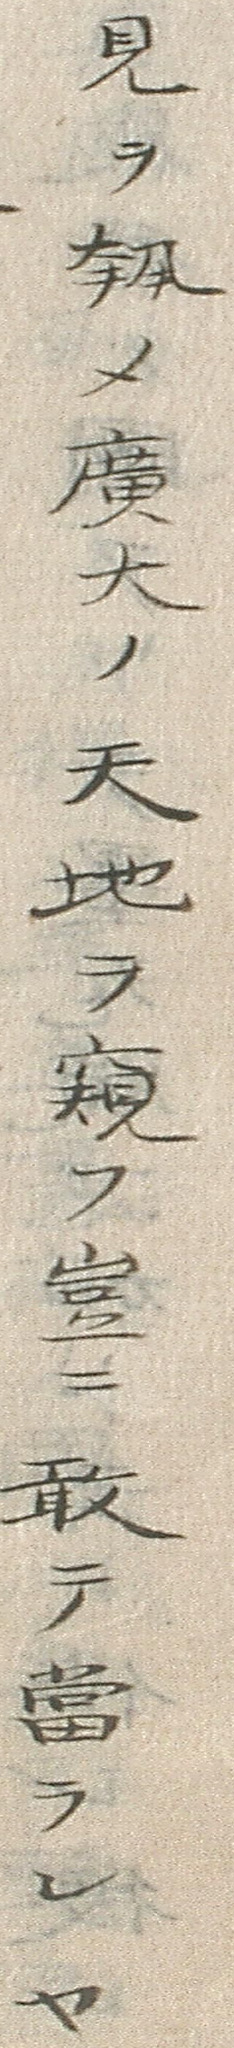見ヲ執シテ広大ノ天地ヲ窺フ豈ニ敢テ当ラレヤ
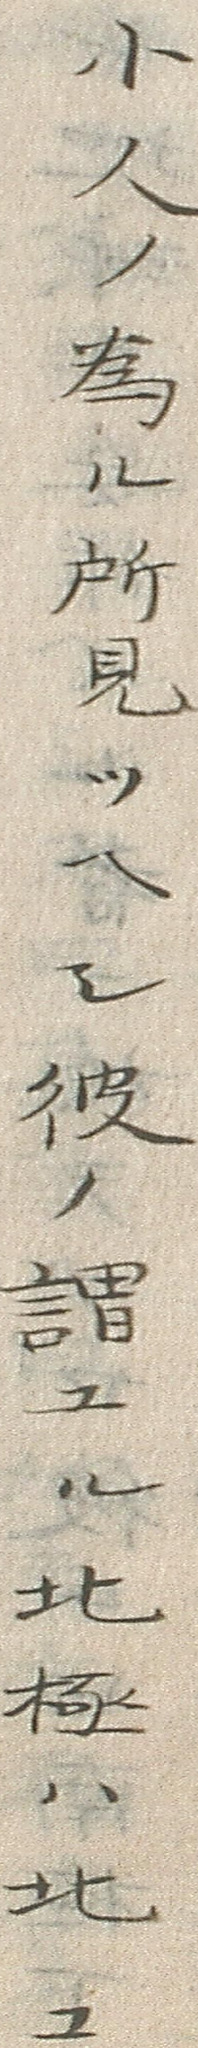小人ノ為ル所見ッヘシ彼ノ謂ユル北極ハ北ニ
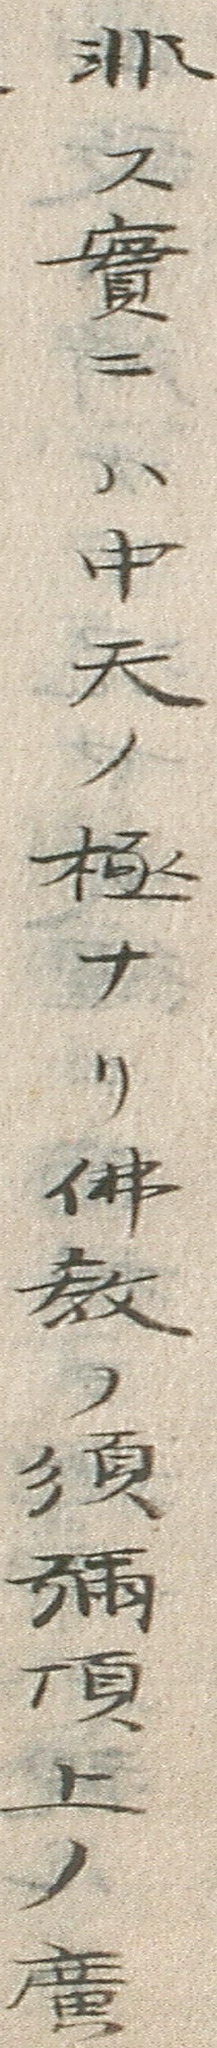非ス実ニハ中天ノ極ナリ仏教ノ須弥頂上ノ広
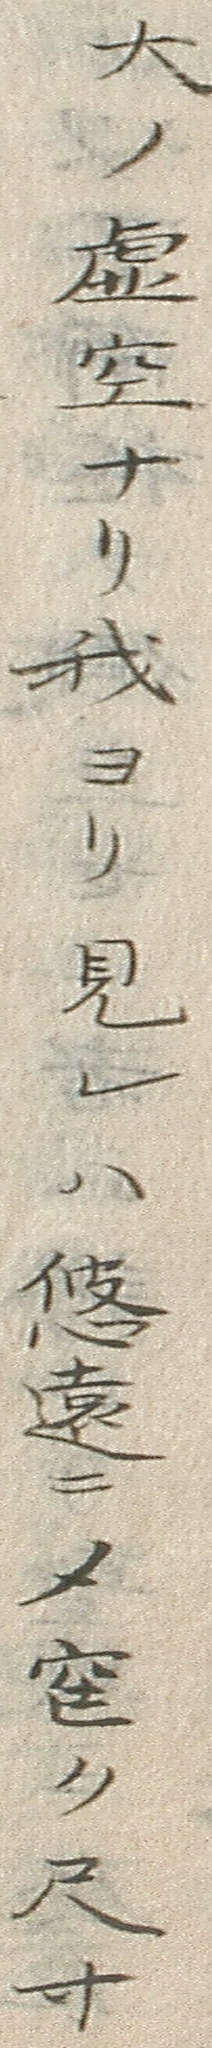大ノ虚空ナリ我ヨリ見レハ悠遠ニシテ窄〃尺寸
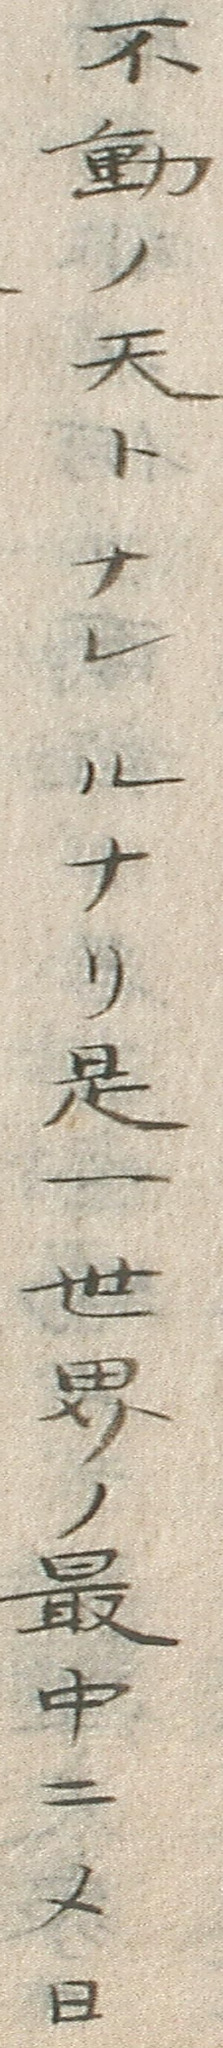不動ノ天トナレルナリ是一世界ノ最中ニシテ日
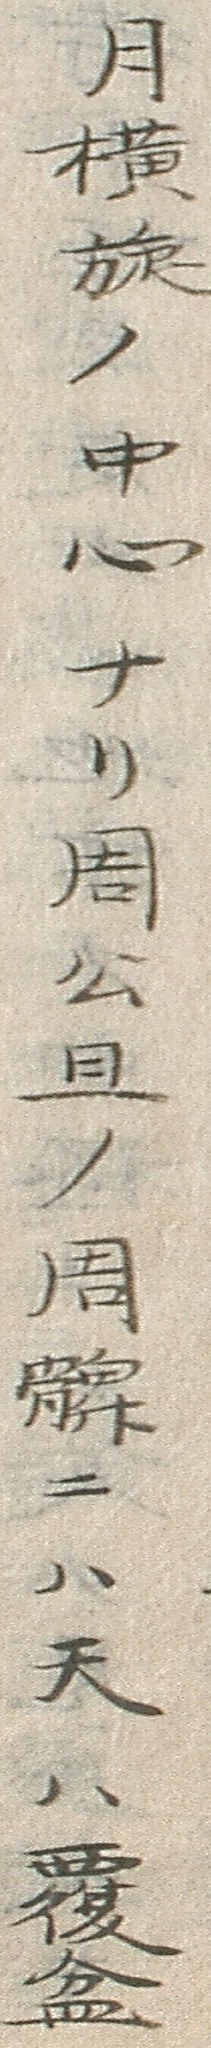月横旋ノ中心ナリ周公旦ノ周髀ニハ天ハ覆盆
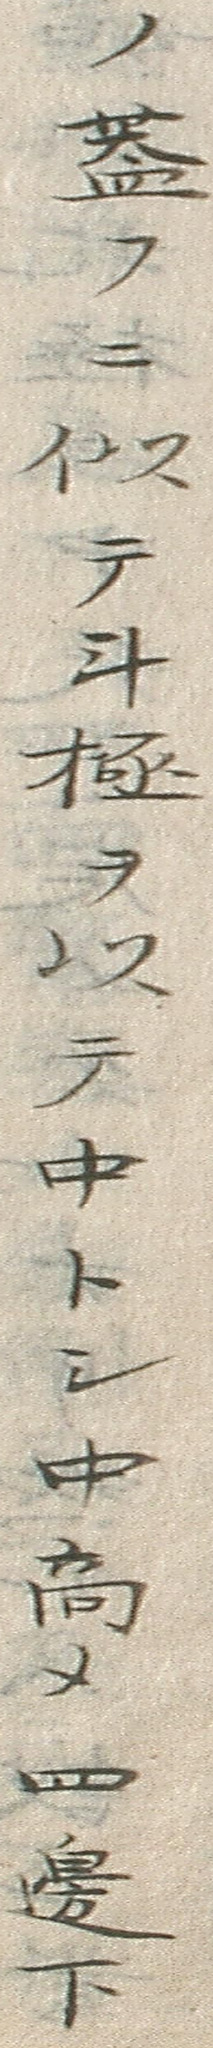ノ葢フニ似テ斗極ヲ以テ中トシ中高シテ四辺下
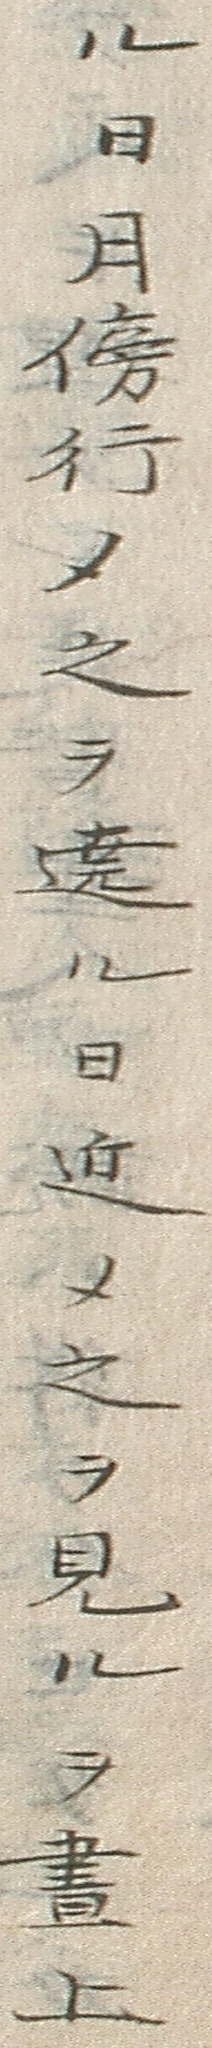ル日月傍行シテ之ヲ遶ル日近シテ之ヲ見ルヲ昼上
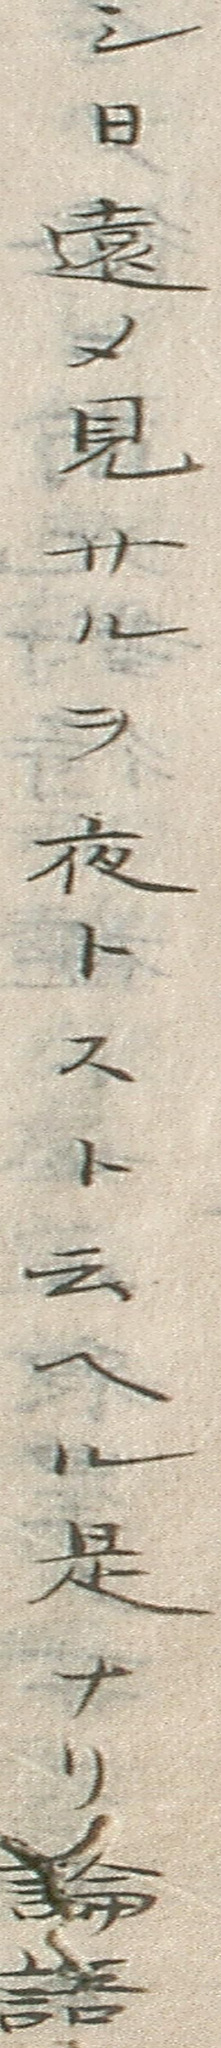シ日遠シテ見サルヲ夜トスト云ヘル是ナリ論語
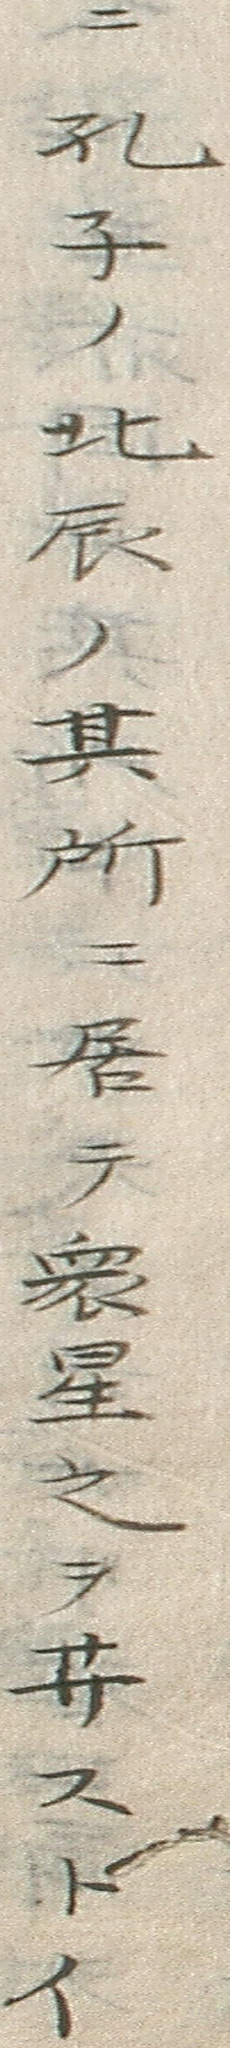ニ孔子ノ北辰ノ其所ニ居テ衆星之ヲストイ
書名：天學略名目羽翼　全
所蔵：東京大学地震研究所図書室 Earthquake Research Institute Library, The University of Tokyo, JAPAN
